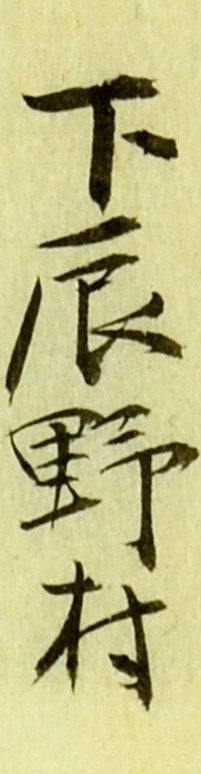下辰野村
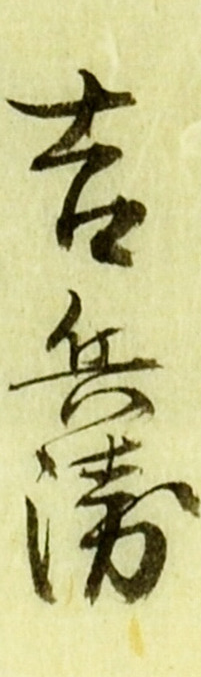吉兵衛
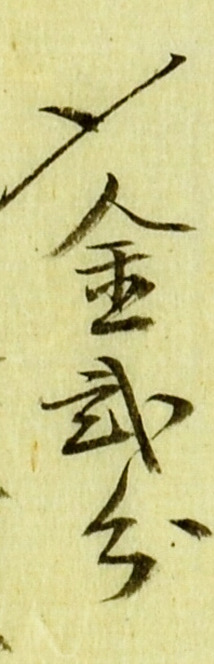〆金弐分
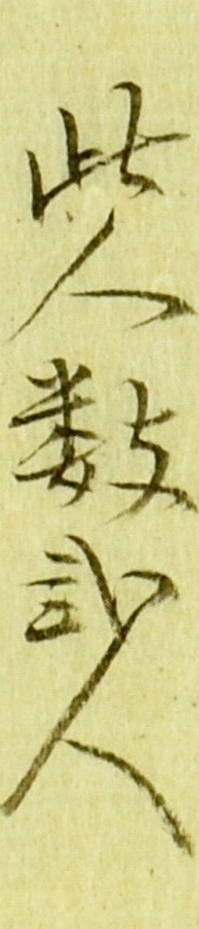此人数弐人
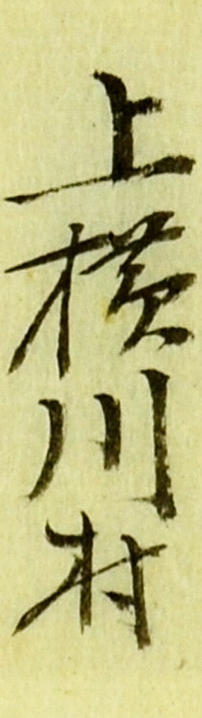上横川村
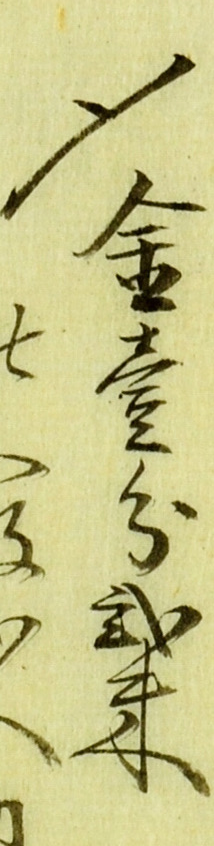〆金壱分弐朱
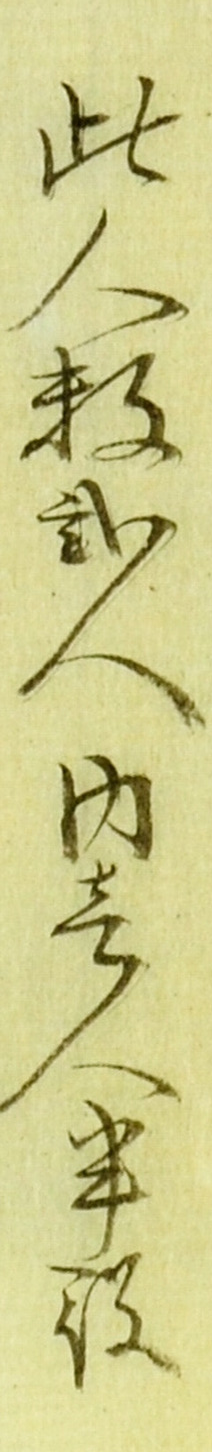此人数弐人内壱人半役
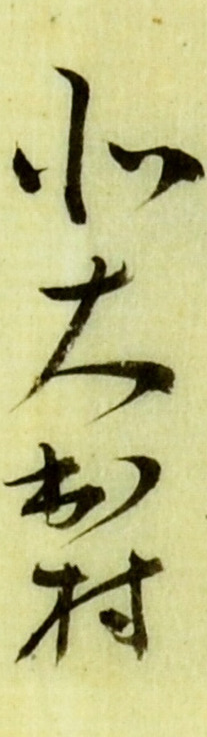北大出村

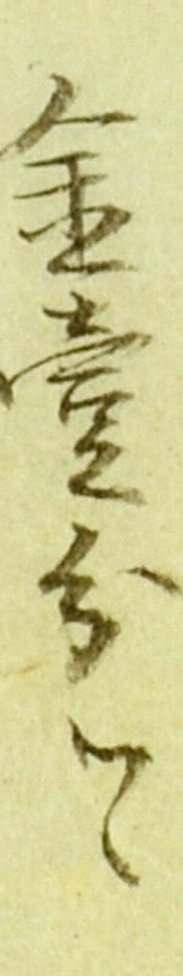金壱分善八
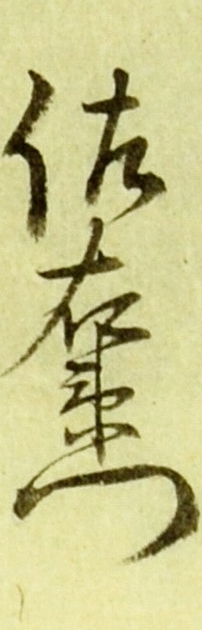八右衛門
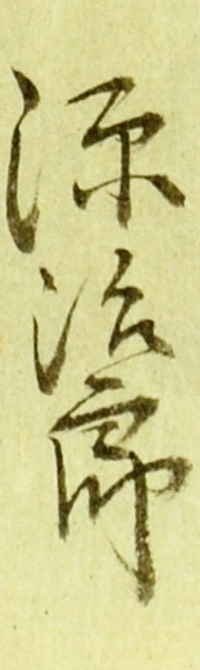源治郎
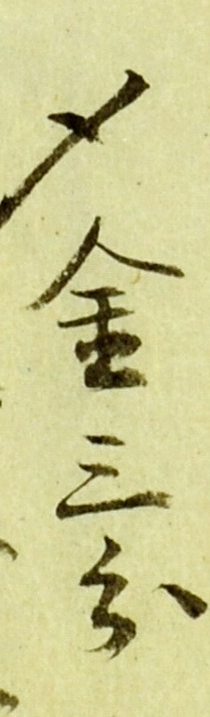〆金三分
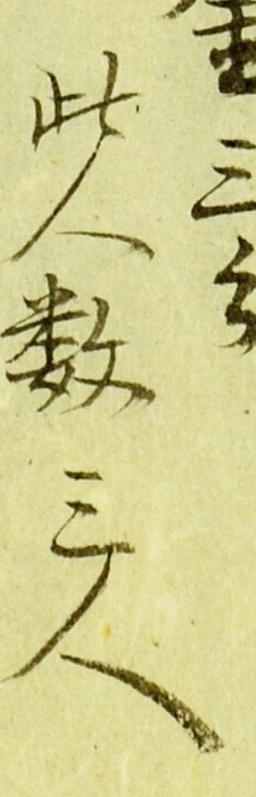此人数三人
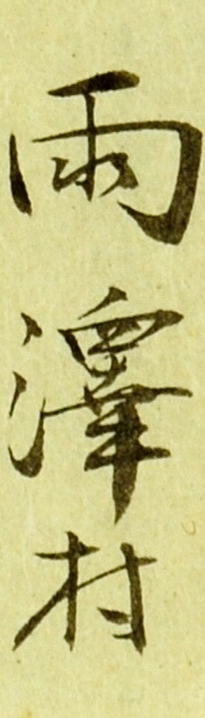雨沢村
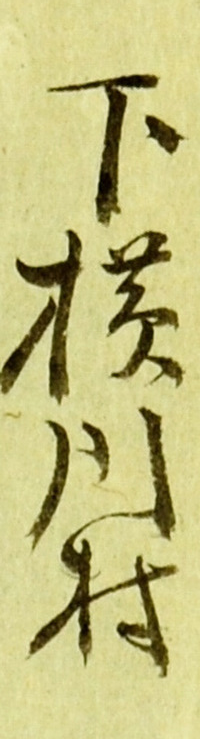下横川村
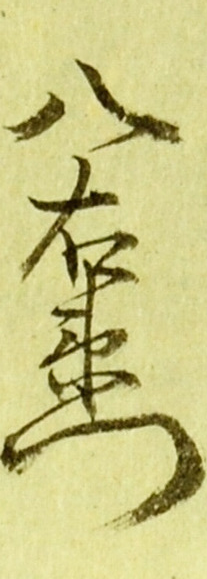八右衛門
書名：上伊那郷諸運上取調帳
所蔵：伊那市立高遠町図書館・合同会社AMANE
